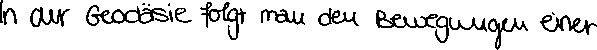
In der Geodäsie folgt man den Bewegungen einer
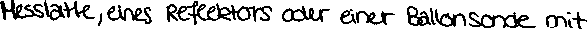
Messlatte, eines Reflektors oder einer Ballonsonde mit
